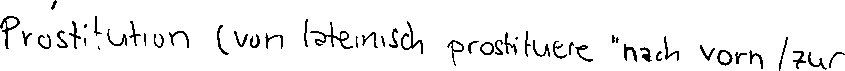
Prostitution (von lateinisch prostituere "nach vorn/zur
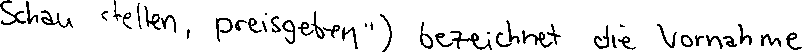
Schau stellen, preisgeben") bezeichnet die Vornahme
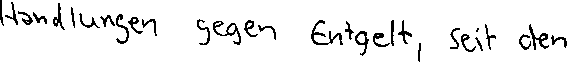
Handlungen gegen Entgelt, seit den
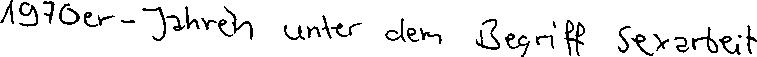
1970er-Jahren unter dem Begriff Sexarbeit
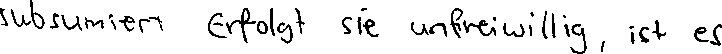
subsumiert. Erfolgt sie unfreiwillig, ist es
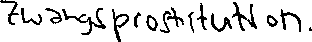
Zwangsprostitution.
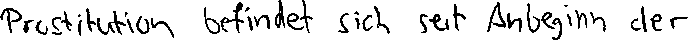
Prostitution findet sich seit Anbeginn der
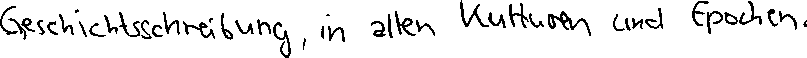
Geschichtsschreibung, in allen Kulturen und Epochen.
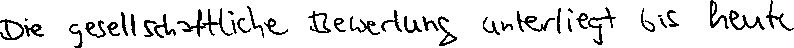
Die gesellschaftliche Bewertung unterliegt bis heute
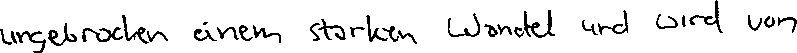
ungebrochen einem starken Wandel und wird von
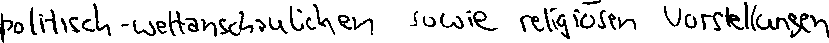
politisch-weltanschaulichen sowie religiösen Vorstellungen
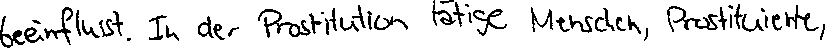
beeinflusst. In der Prostitution tätige Menschen, Prostituierte,
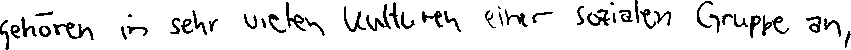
gehören in vielen Kulturen einer sozialen Gruppe an,
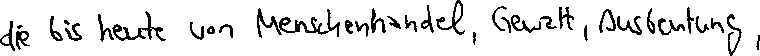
die bis heute von Menschenhandel, Gewalt, Ausbeutung,
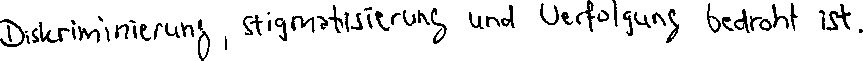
Diskriminierung, Stigmatisierung und Verfolgung bedroht ist.
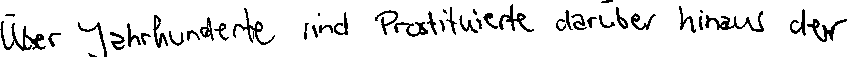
Über Jahrhunderte sind Prostituierte darüber hinaus der
